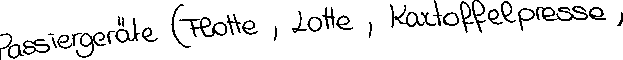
Passiergeräte (Flotte Lotte, Kartoffelpresse,
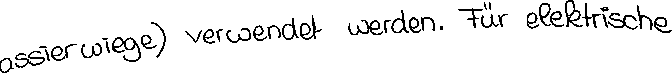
assierwiege) verwendet werden. Für elektrische
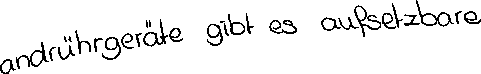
andrührgeräte gibt es aufsetzbare
